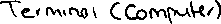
Terminal (Computer)
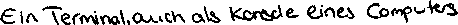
in Terminal, auch als Konsole eines Computers
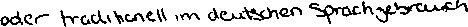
traditionell im deutschen Sprachgebrauch
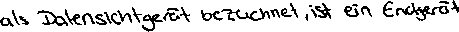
als Datensichtgerät bezeichnet, ist ein Endgerät
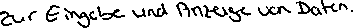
zur Eingabe und Anzeige von Daten.
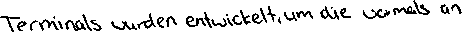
Terminals wurden entwickelt, um die vormals an
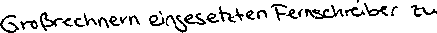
Großrechnern eingesetzten Fernschreiber zu
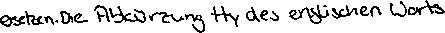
ersetzen. Die Abkürzung tty des englischen Worts
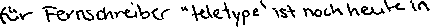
für Fernschreiber "teletype" ist noch heute in
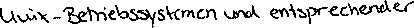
Unix-Betriebssystemen und entsprechende
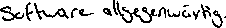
Software allgegenwärtig.
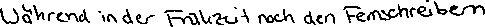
Während in der Frühzeit noch den Fernschreibern
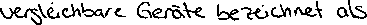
vergleichbare Geräte bezeichnet als
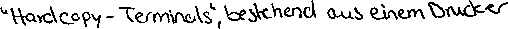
"Hardcopy-Terminals", bestehend aus einem Drucker
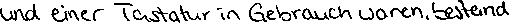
und einer Tastatur in Gebrauch waren, bestand
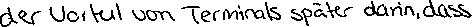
der Vorteil von Terminals später darin, dass
